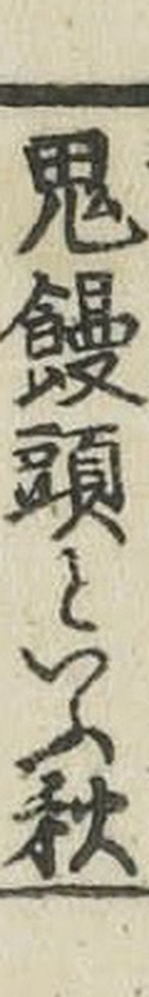木饅頭といふ又
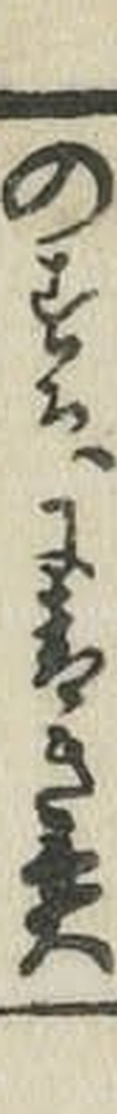のすゑに青き実
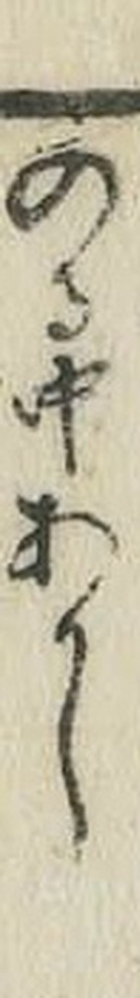のる中あかし
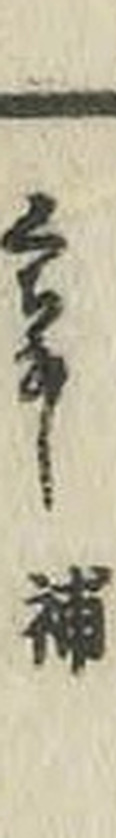梔くちなし
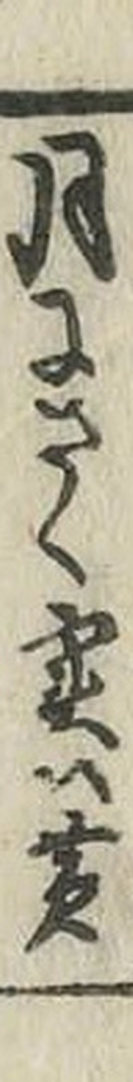月にさく実は黄
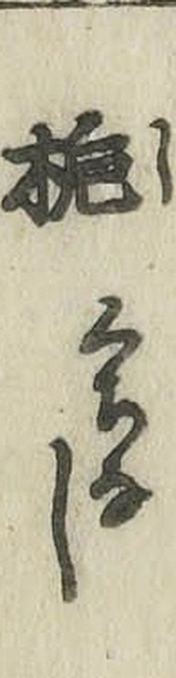梔くちなし
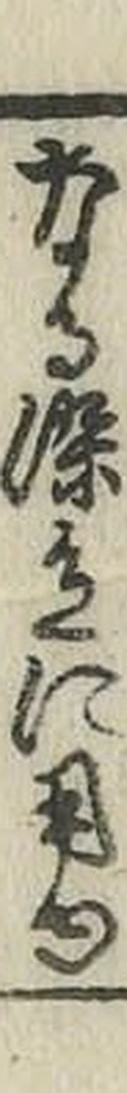なる染色に用ゆ
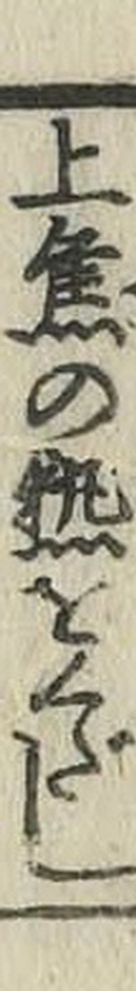上焦の熱をくだし
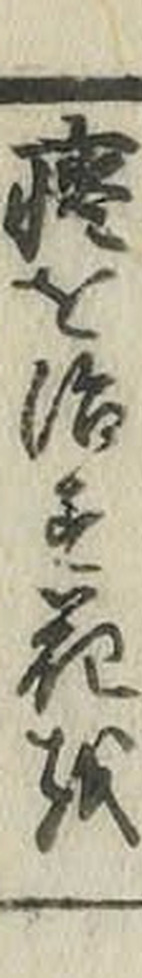痰を治す花を
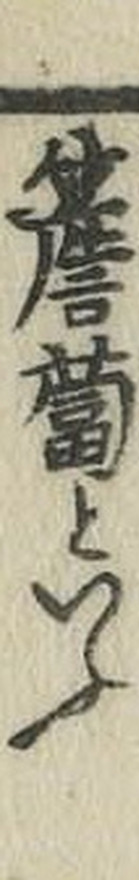薝匐といふ

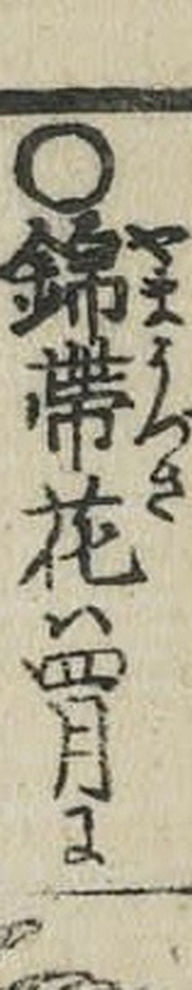○錦帯花は四月に
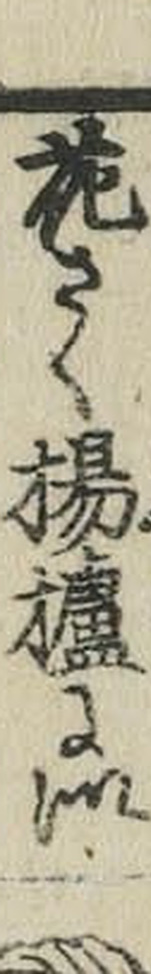花さく楊櫨に似
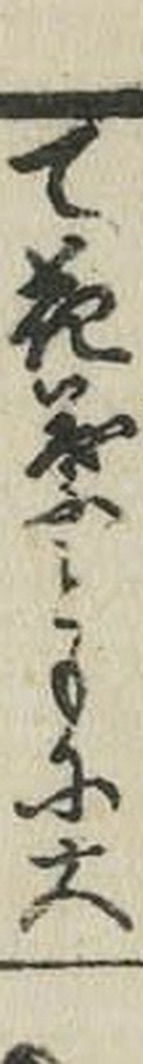て花葉ともに大
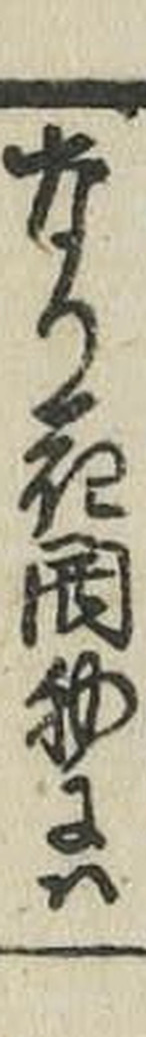なり花開初には
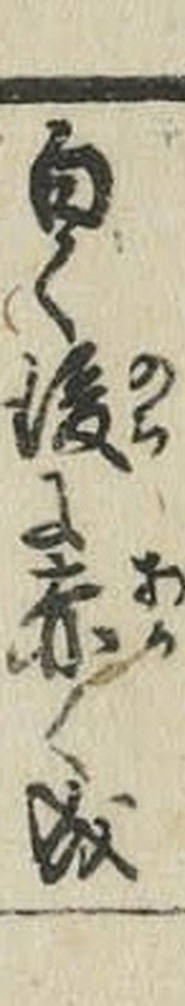白く後に赤く成
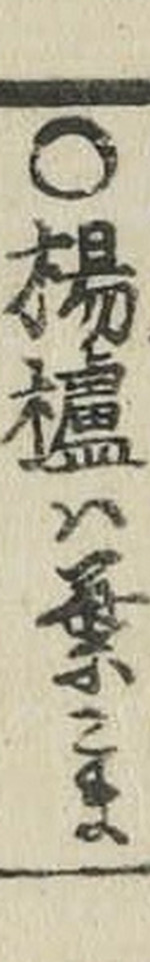○楊櫨は葉こま
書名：増補頭書訓蒙図彙大成 10巻 8:巻之17-19
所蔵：東京学芸大学教育コンテンツアーカイブ
